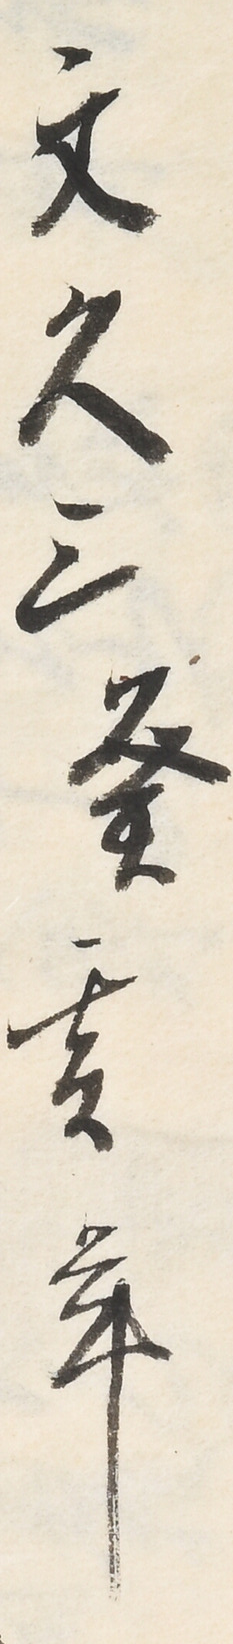㊞文久三癸亥年
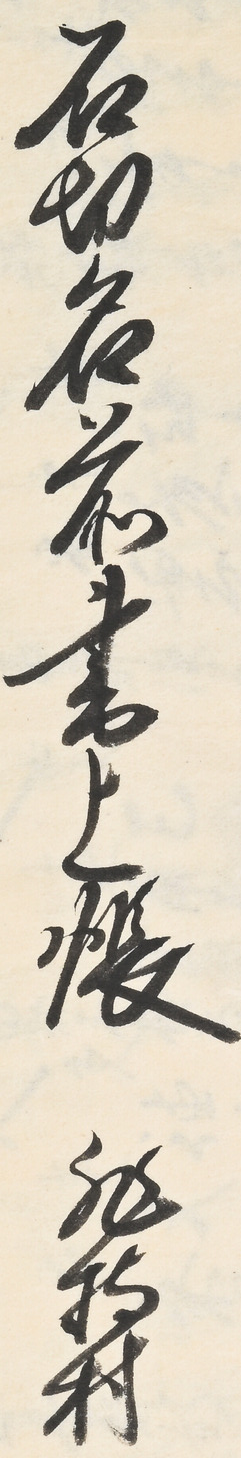石切名前書上帳非持村

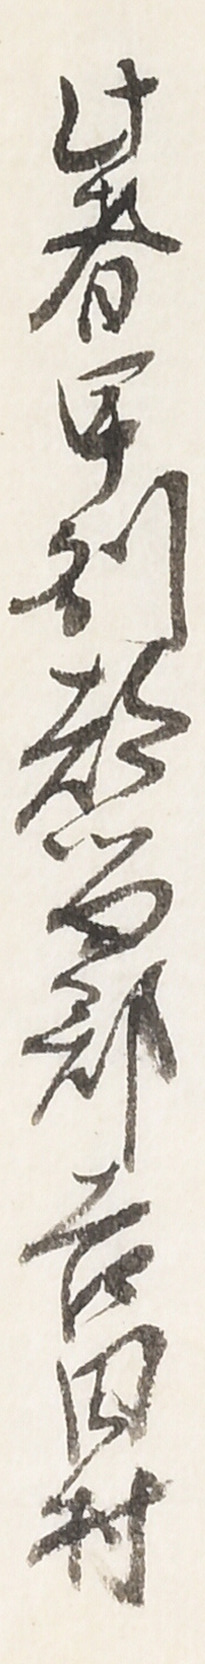此者甲州都留郡吉田村
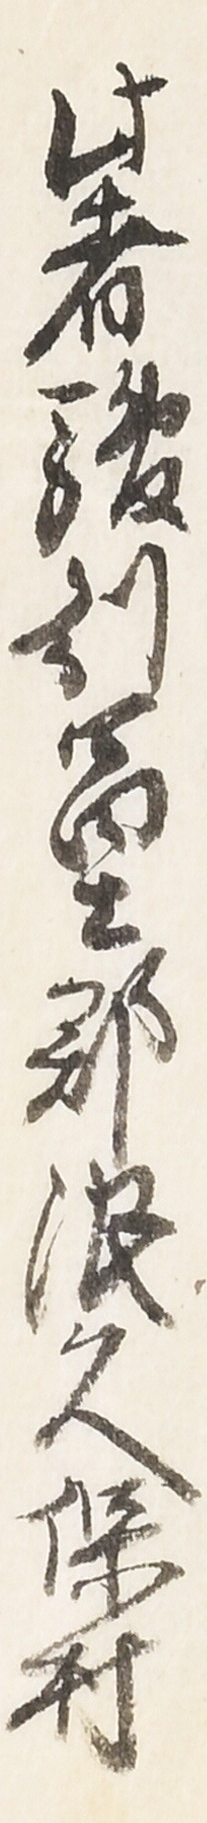此者駿州富士郡浪久保村
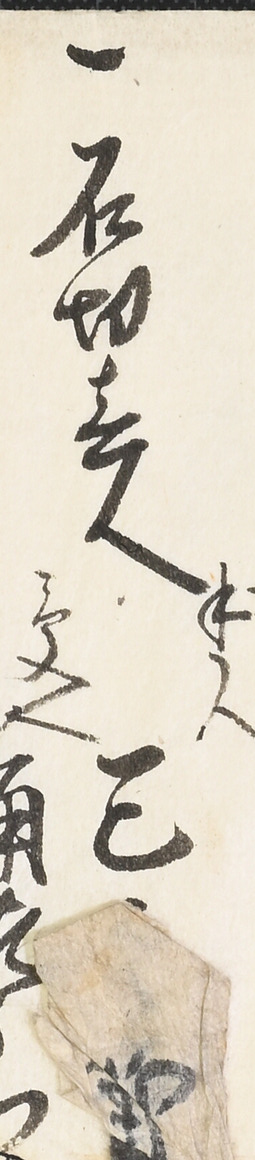一石切壱人本人巳
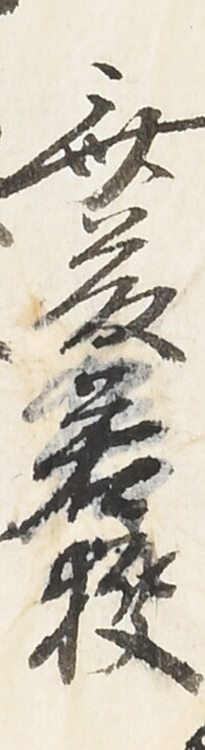無藤若狭
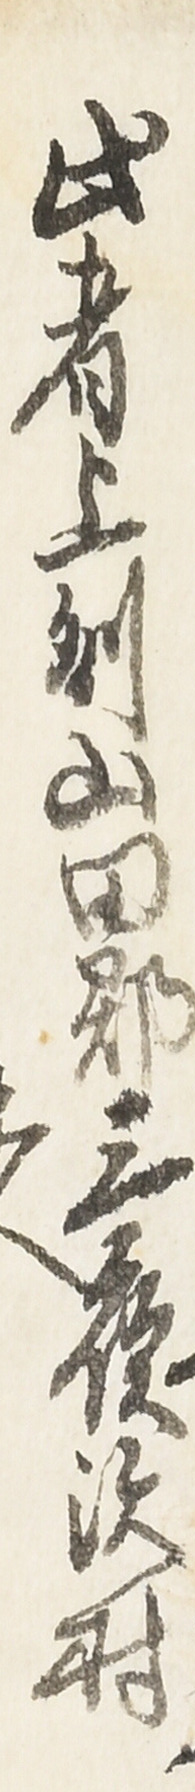此者上州山田郡三夜沢村
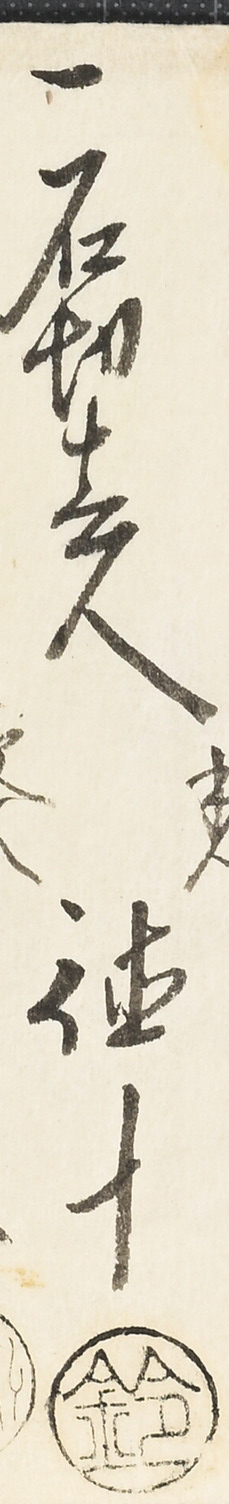一石切壱人本人巳
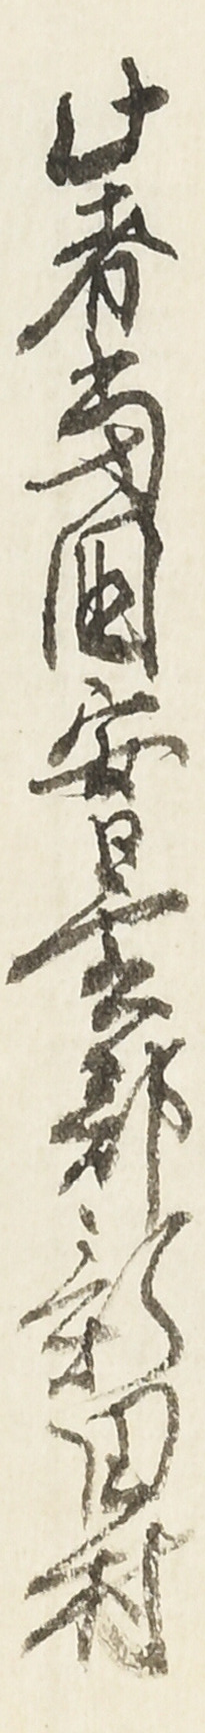此者当国安曇郡新田村

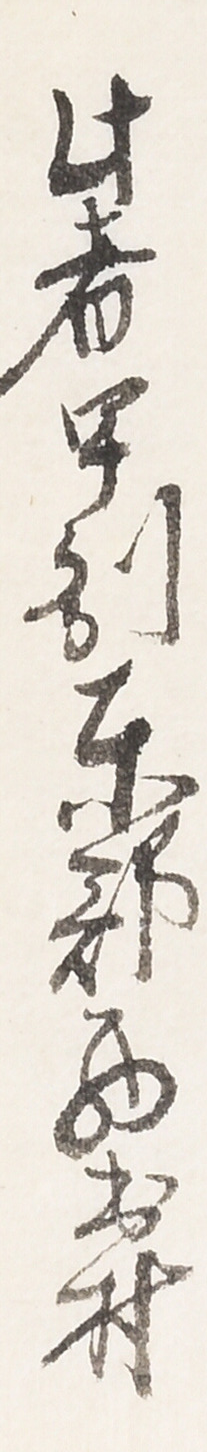此者甲州東郡西出村
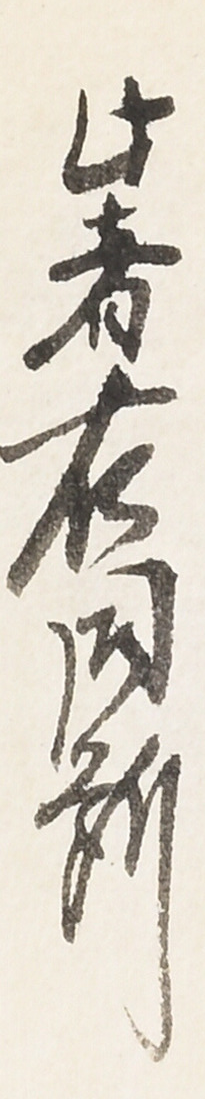此者右同断
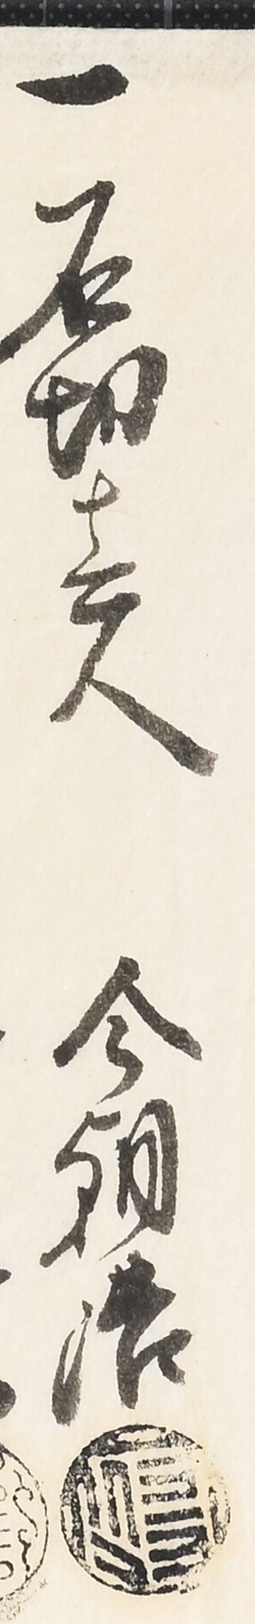一石切壱人今朝治㊞
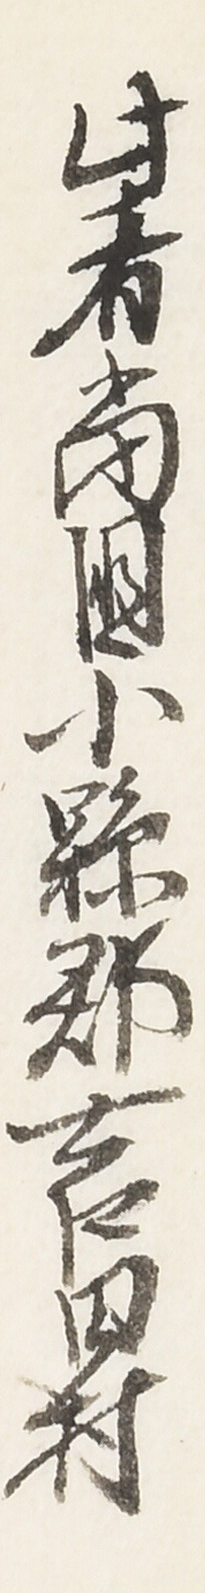此者当国小縣郡吉田村
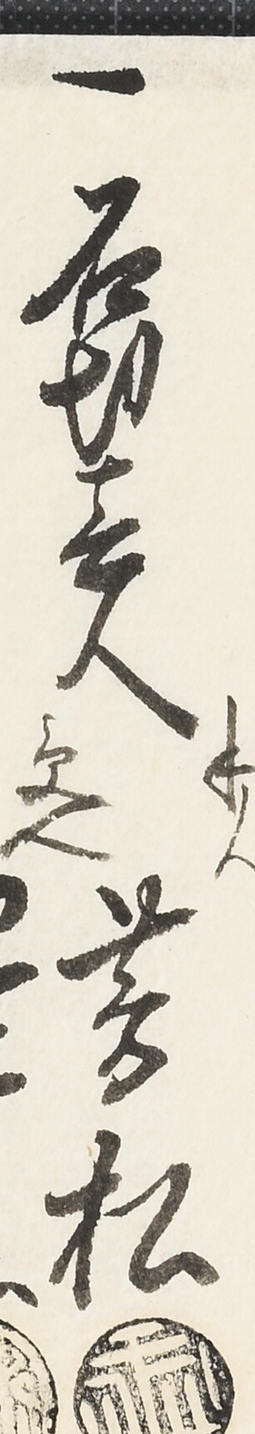一石切壱人本人芳松㊞
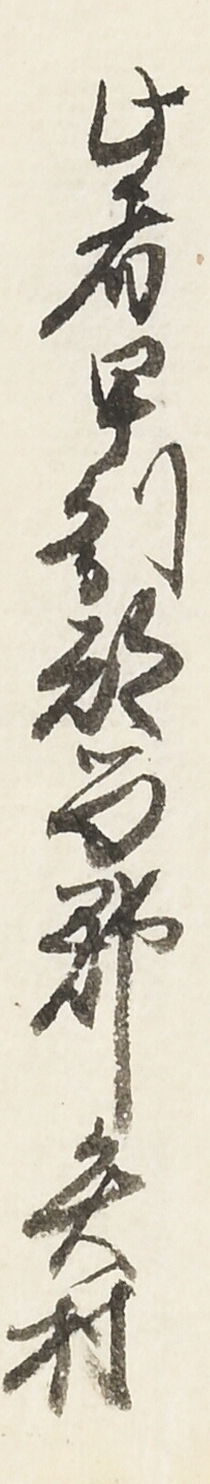此者甲州都留郡矢村
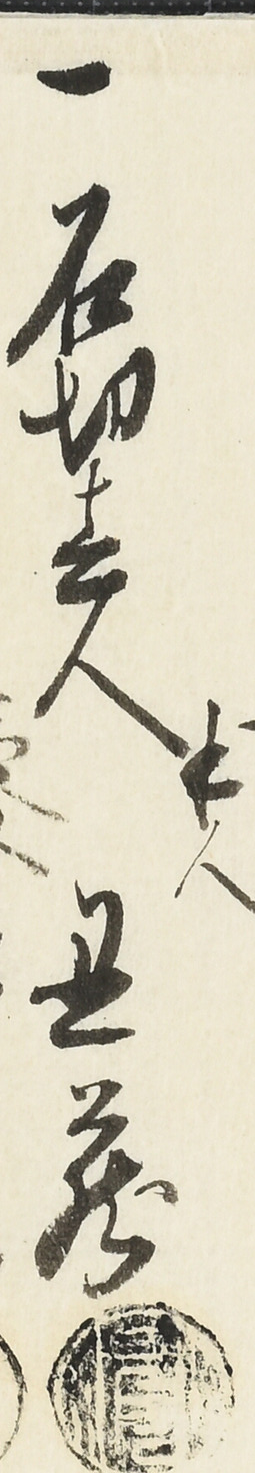一石切壱人今朝治㊞
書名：文久三癸亥年正月石切名前書上帳
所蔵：伊那市立高遠町図書館・合同会社AMANE
